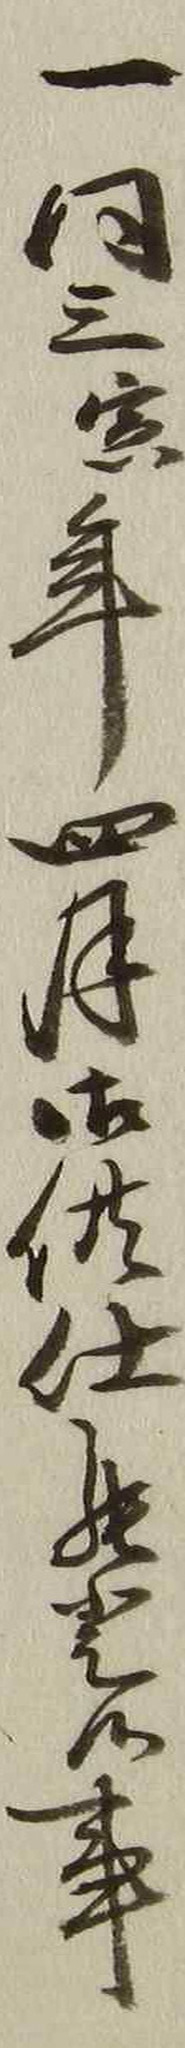一同三寅年四月御供仕罷登候事
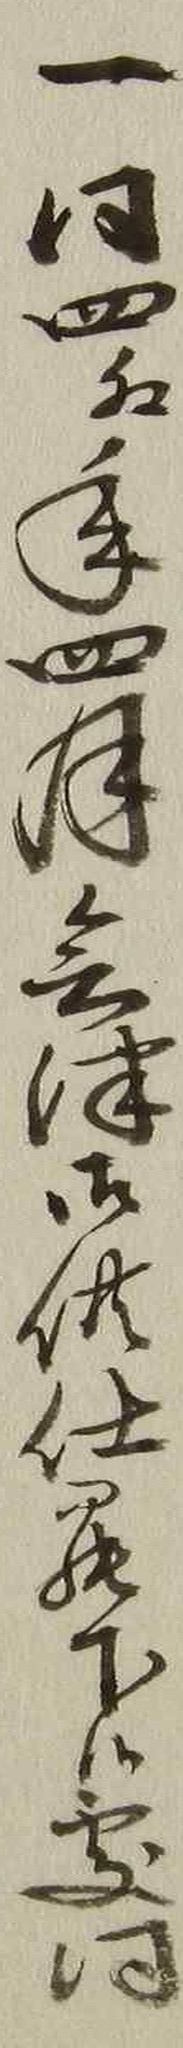一同四卯年四月会津御供仕罷下候処同
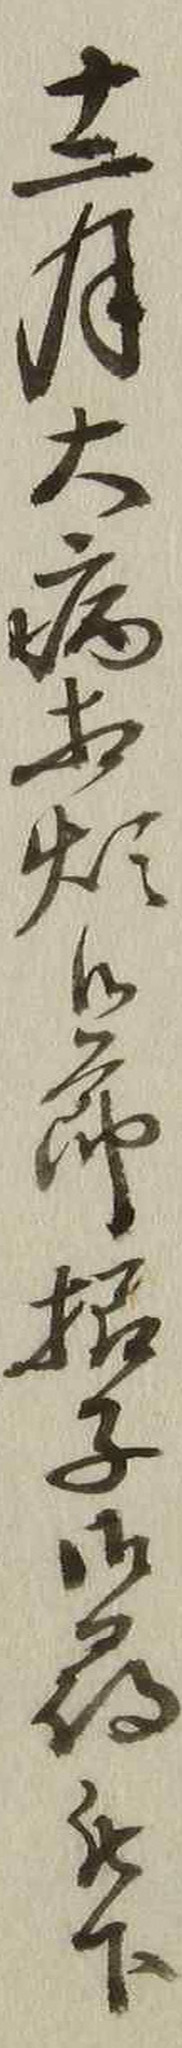十二月大病相煩候節様子御尋被下
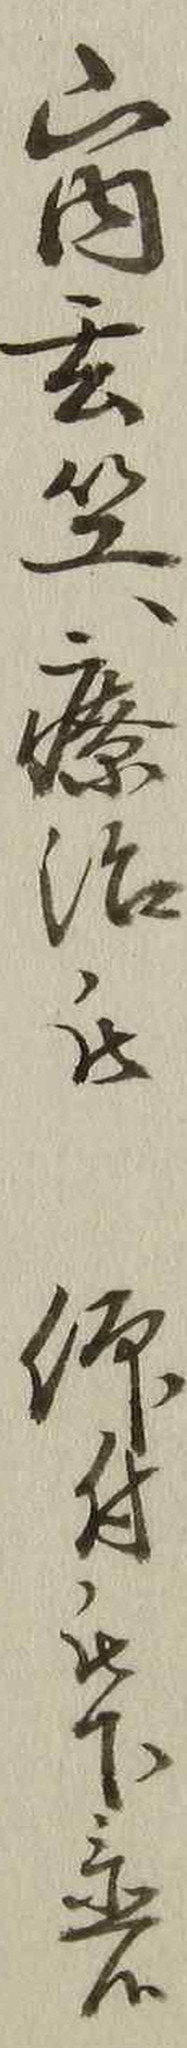山内玄竺へ療治被仰付被下置候
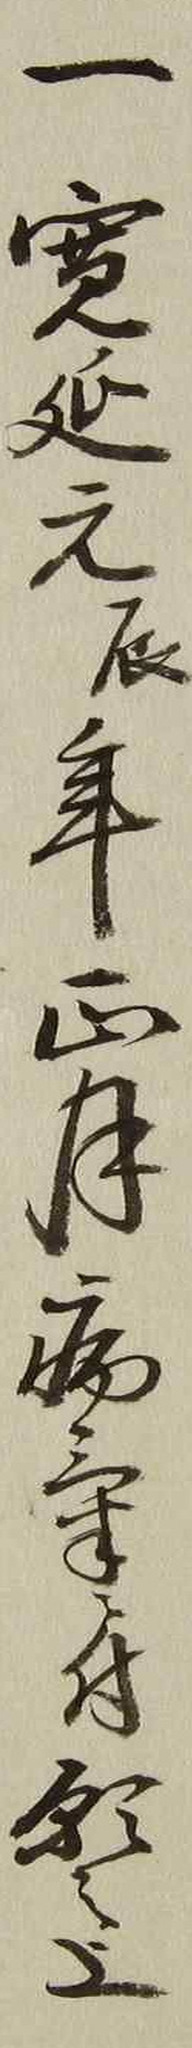一寛延元辰年正月病気ニ付願之上
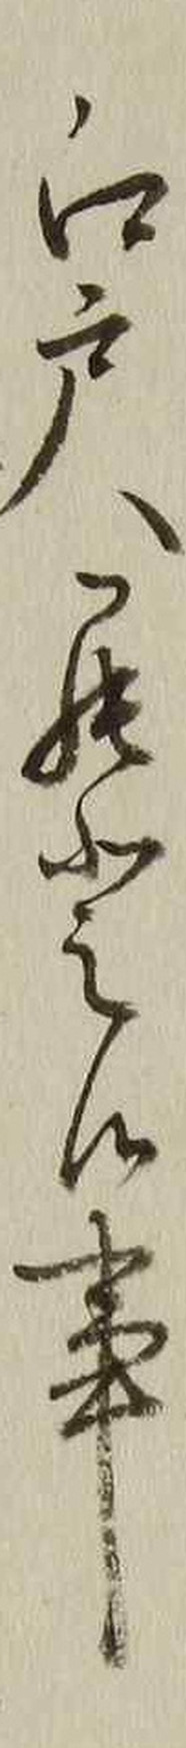江戸へ罷登候事
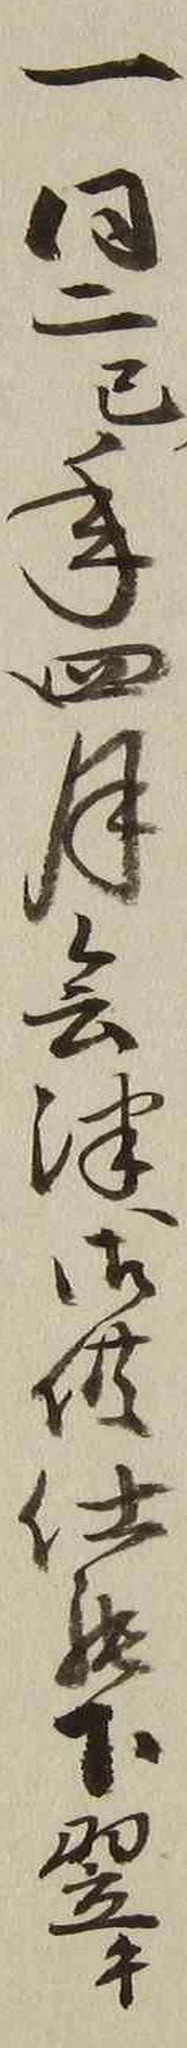一同二巳年四月会津へ御供仕罷下翌午
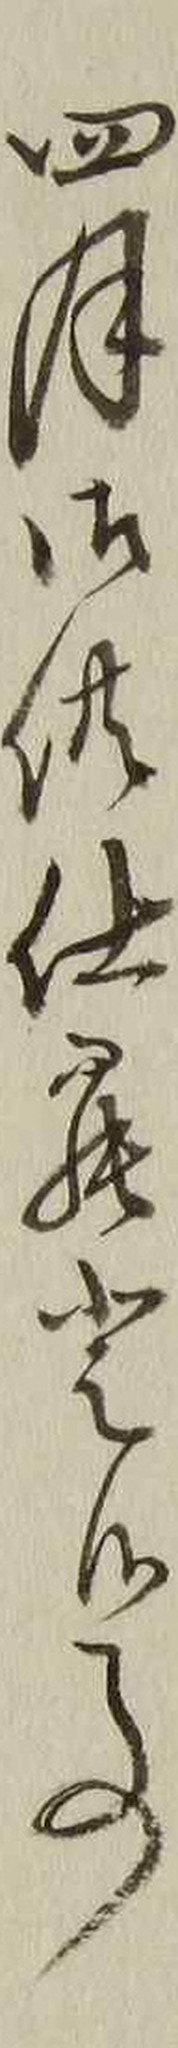四月御供仕罷登候事
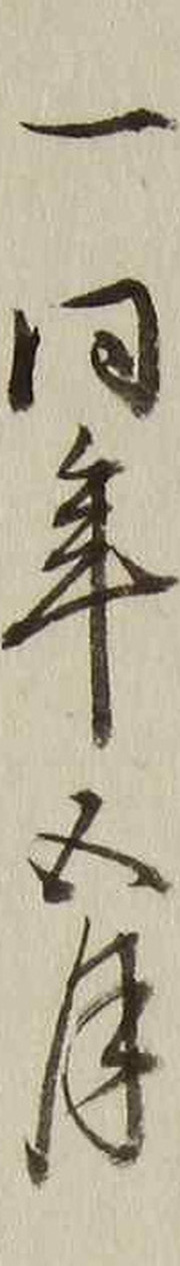一同年五月
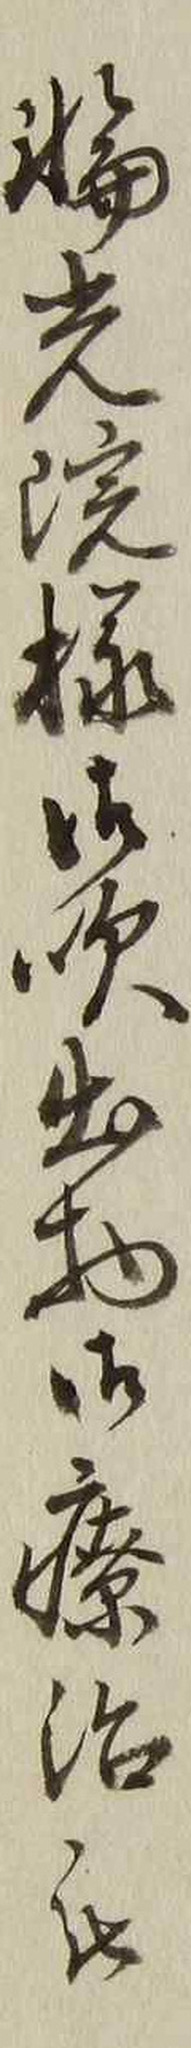輪光院様御吹出物御療治被
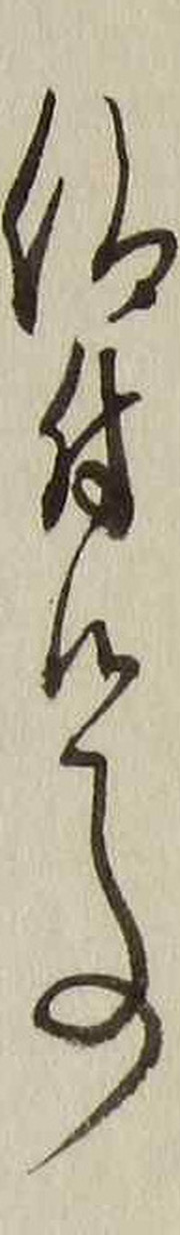仰付候事
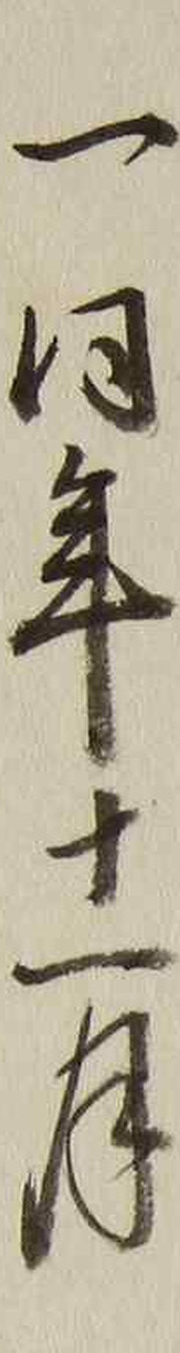一同年十一月
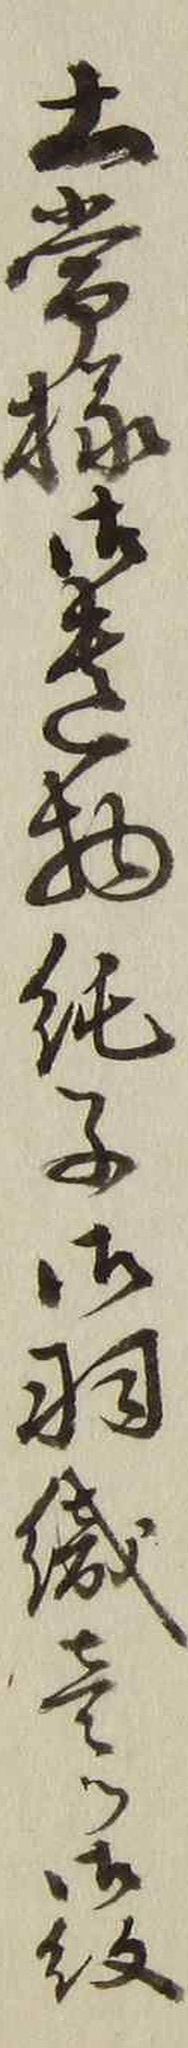土常様御遣物純子御羽織壱ツ御紋
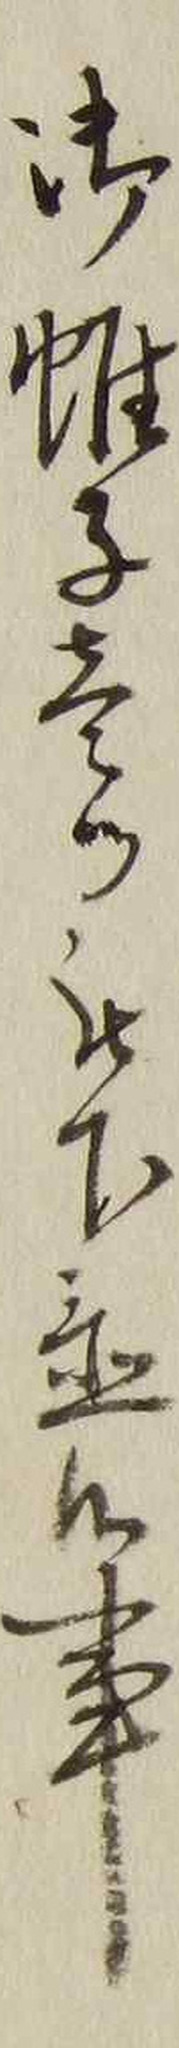御帷子壱ツ被下置候事

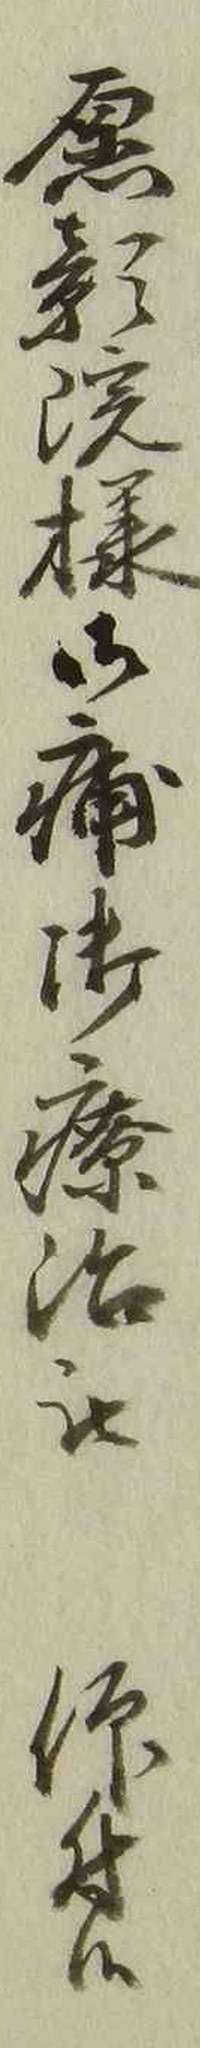愿彰院様御痛御療治被仰付候
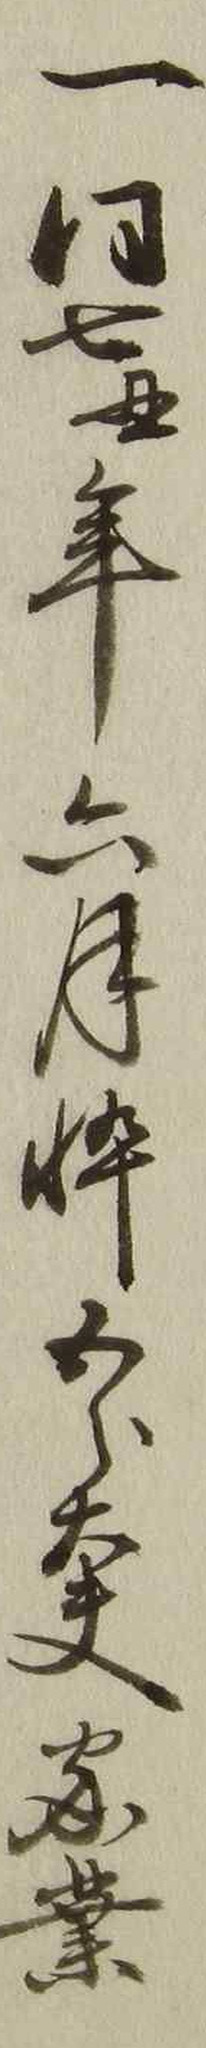一同七丑年六月忰五郎太夫家業
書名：諸士系譜　巻之31　い之部31
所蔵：会津若松市立会津図書館
